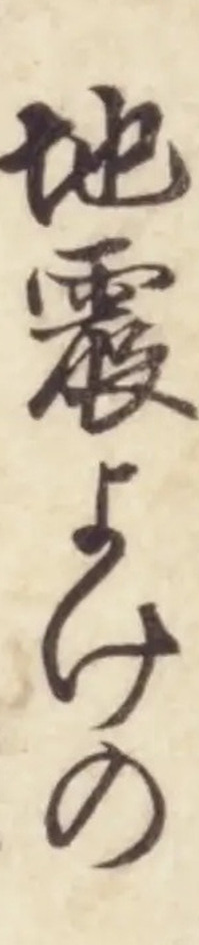地震よけの
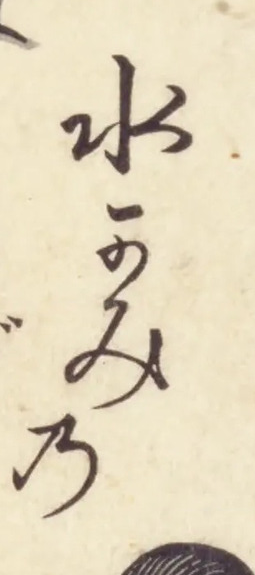水かみの
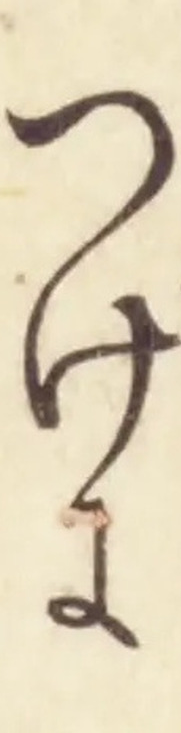つげに
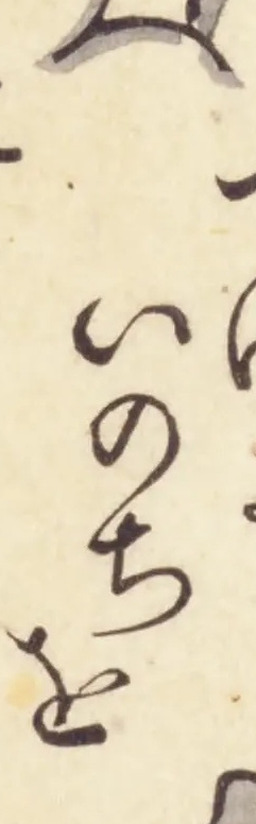いのちを
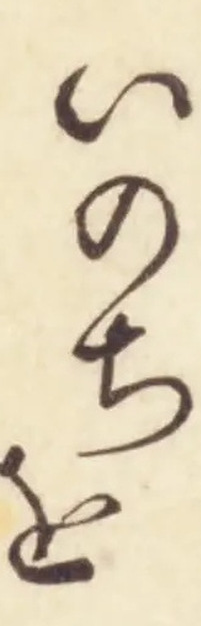いのちを
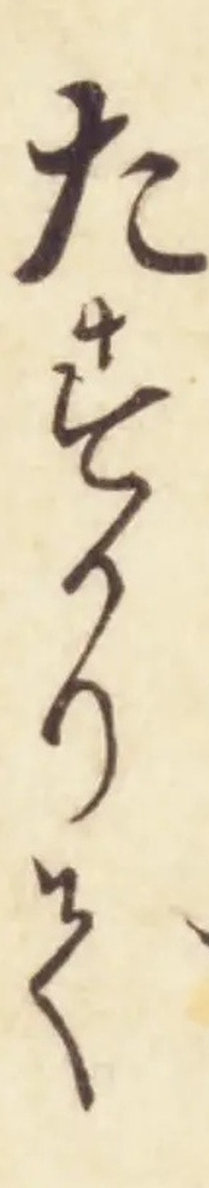たすかりて
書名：地震よけの歌
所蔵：国立国会図書館 National Diet Library, JAPAN
